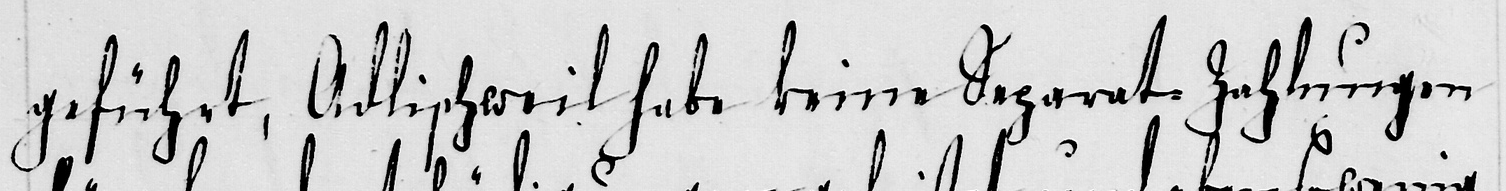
geführt, Adlischweil habe keine Separat-Zahlungen
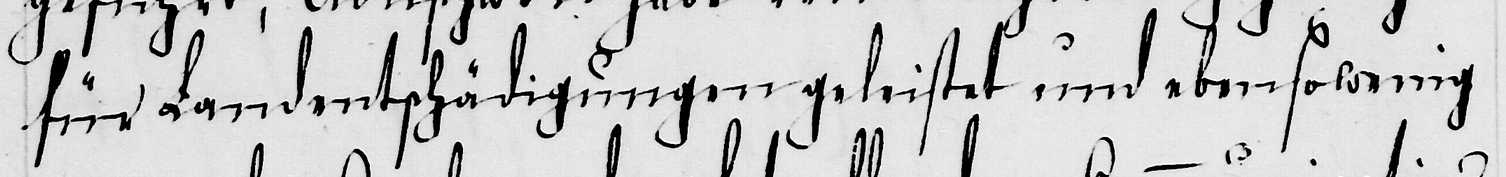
für Landentschädigungen geleistet und ebensowenig
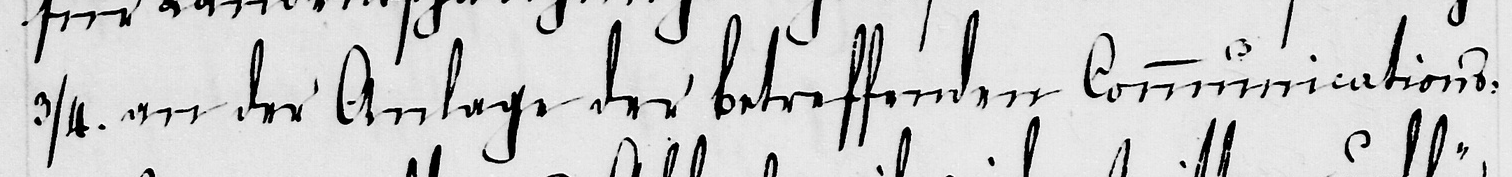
¾. an der Anlage der betreffenden Communications¬
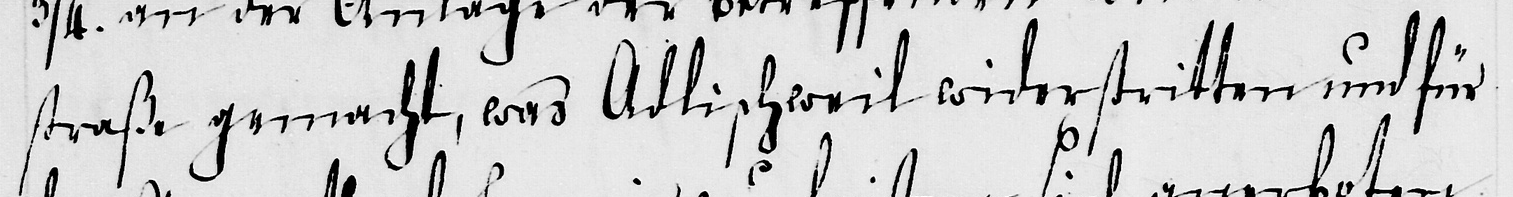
straße gemacht, was Adlischweil widerstritten und für
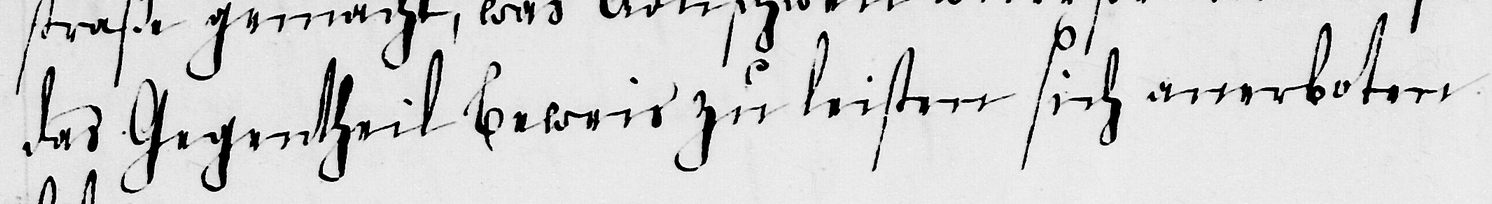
das Gegentheil Beweis zu leisten sich anerboten
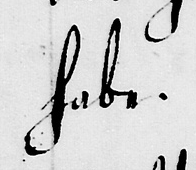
habe.
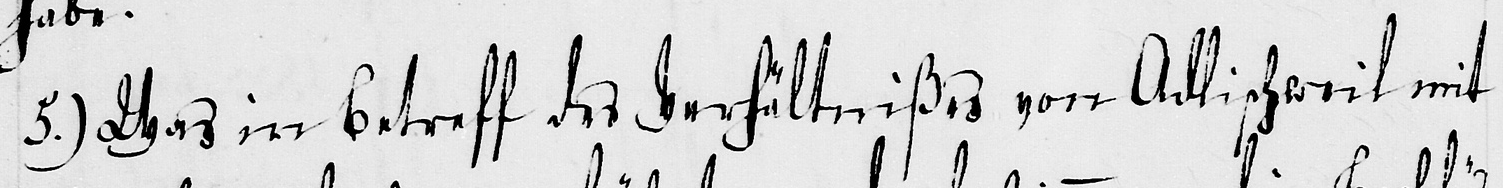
5.) Was in Betreff des Verhältnißes von Adlischweil mit
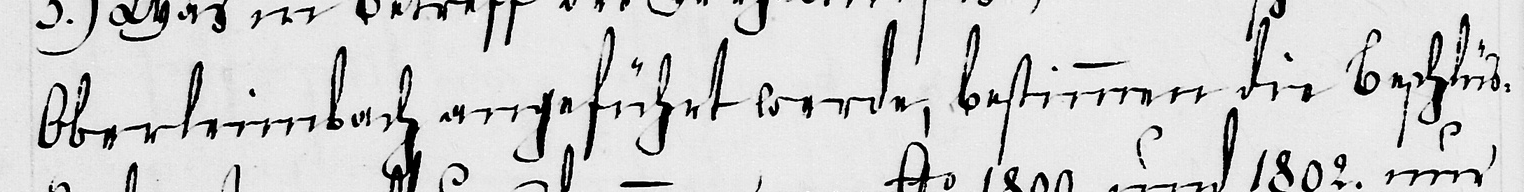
Oberleimbach angeführt werde, bestimmen die Beschlüs¬
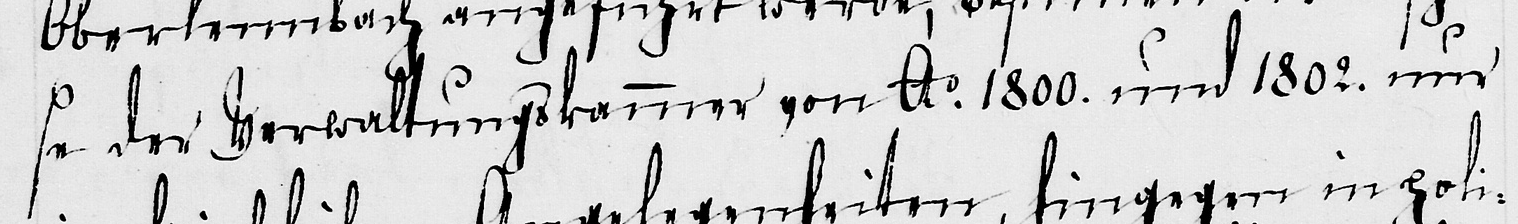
se der Verwaltungskammer von Ao. 1800. und 1802. nur
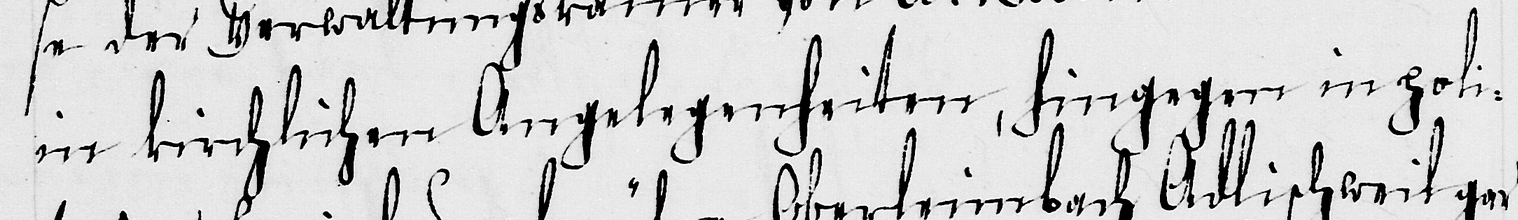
in kirchlichen Angelegenheiten, hingegen in poli¬
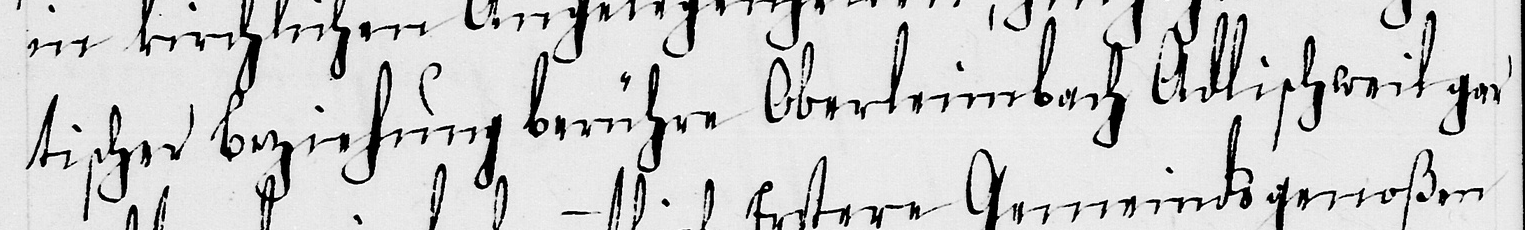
tischer Beziehung berühre Oberleimbach Adlischweil gar
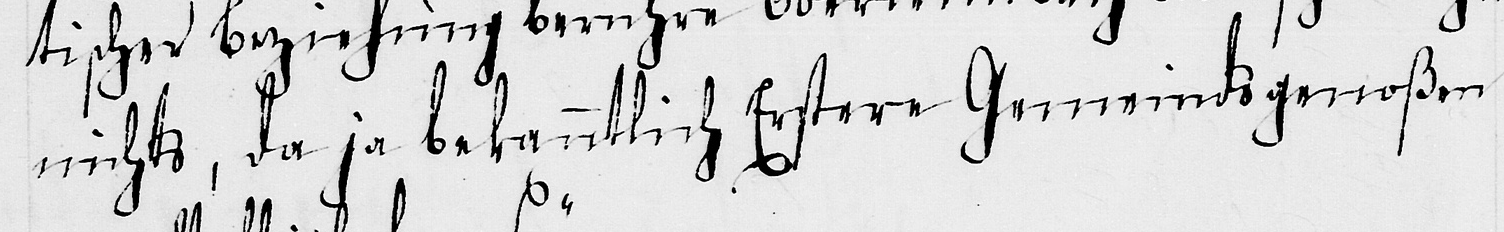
nichts, da ja bekanntlich Erstere Gemeindsgenoßen
